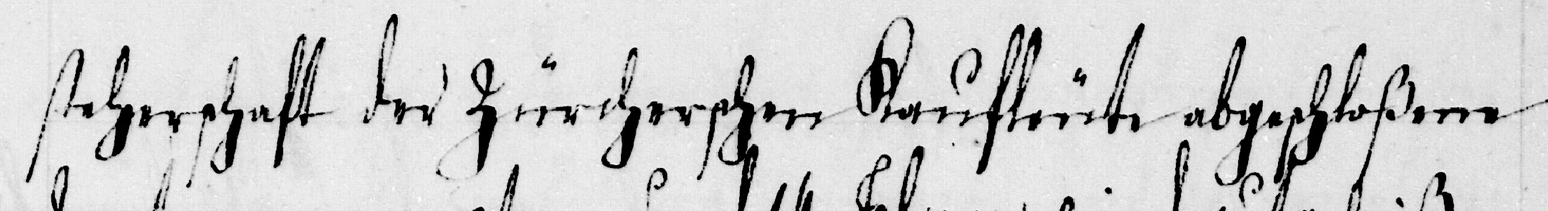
steherschaft der Zürcherschen Kaufleute abgeschloßene
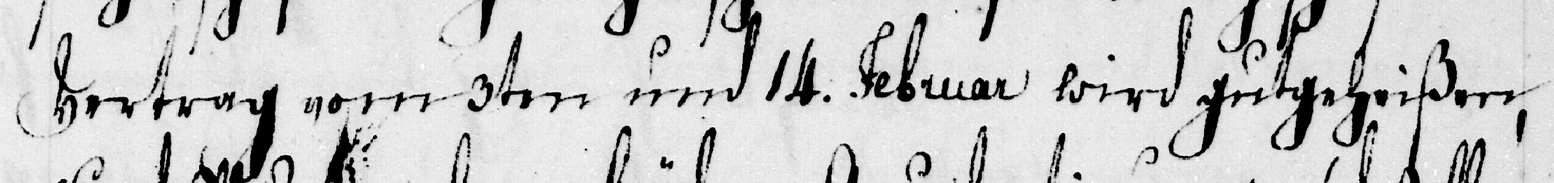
Vertrag vom 3ten und 14. Februar wird gutgeheißen,
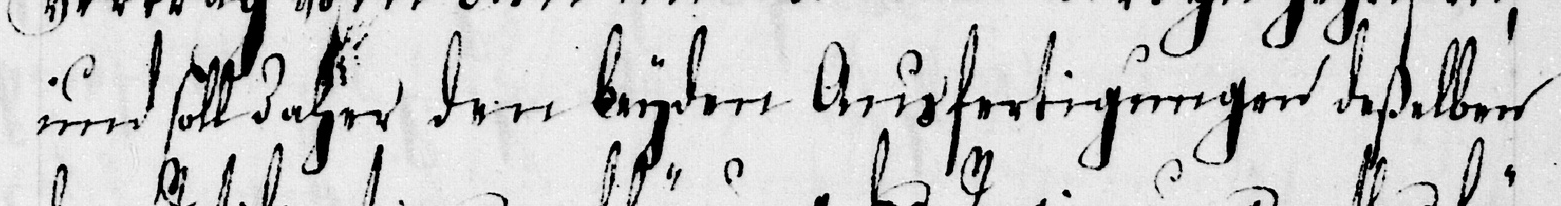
und soll daher den beyden Ausfertigungen deßelben
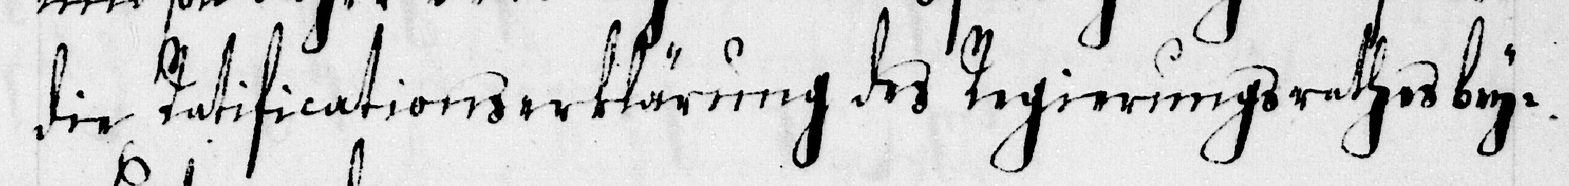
die Ratificationserklärung des Regierunsrathes bey¬
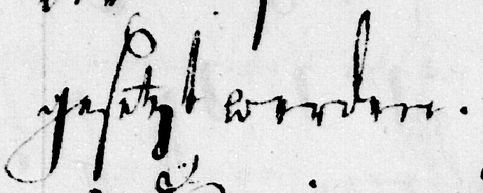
gesetzt werden.
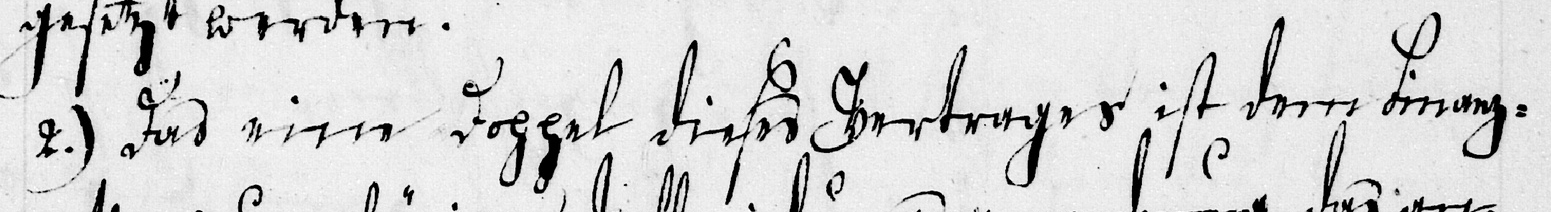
2.) Das eine Doppel dieses Vertrages ist dem Finanz¬
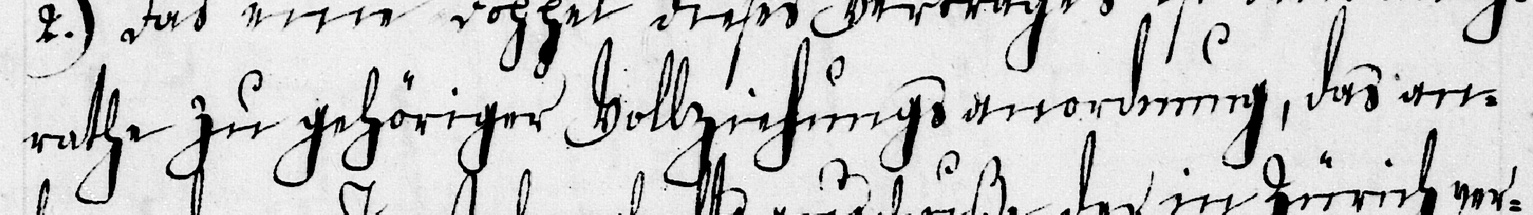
rathe zu gehöriger Vollziehungsanordnung, das an¬
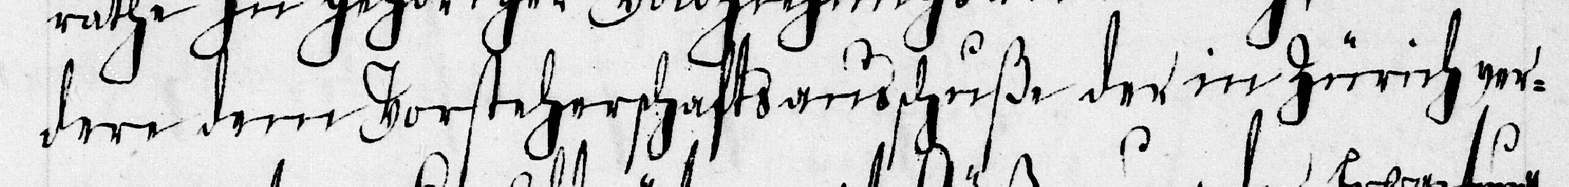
dere dem Vorsteherschaftsausschuße der in Zürich ver¬
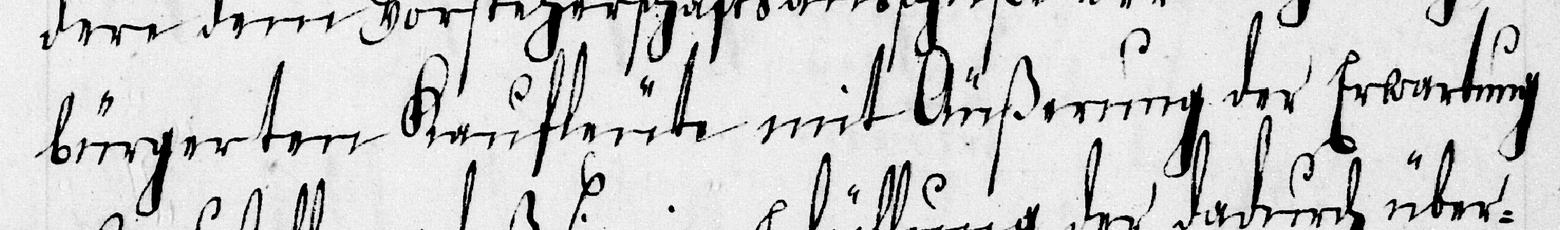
bürgerten Kaufleute mit Äußerung der Erwartung
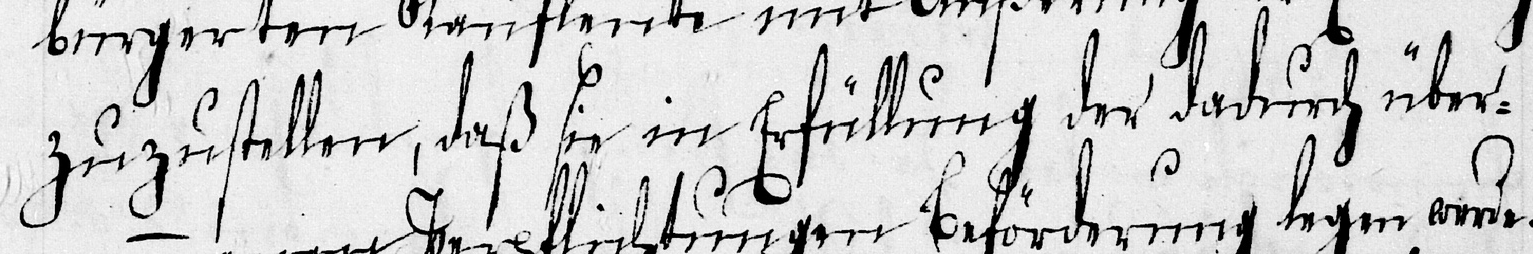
zuzustellen, daß sie in Erfüllung der dadurch über¬
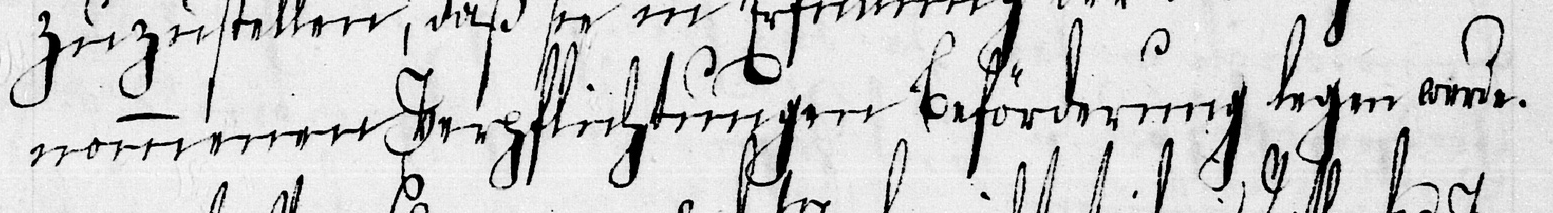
nommenen Verpflichtungen Beförderung legen werde.
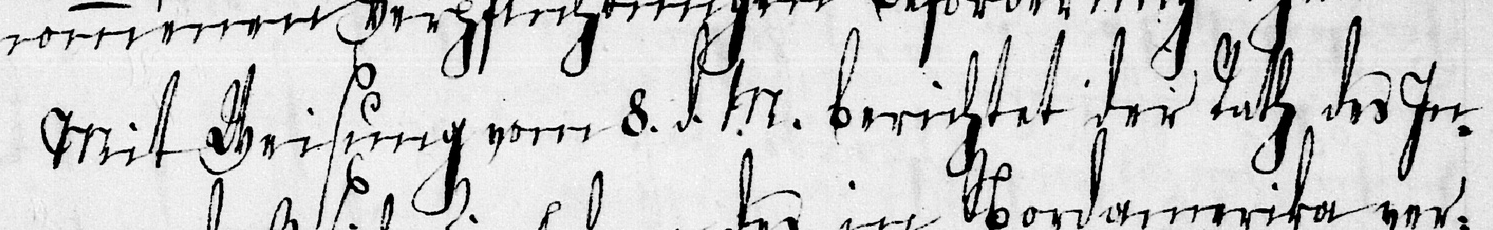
Mit Weisung vom 8. d. M. berichtet der Rath des In¬
